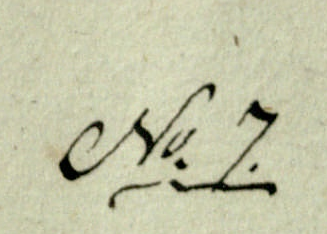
No 7.
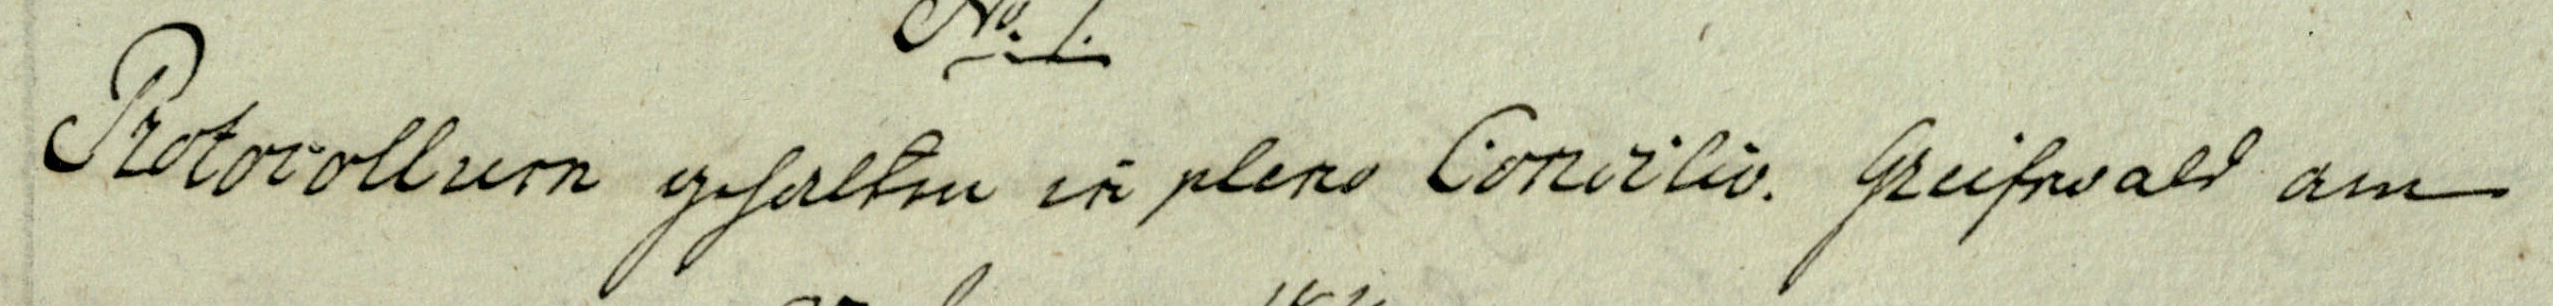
Protocollum gehalten in pleno Concilio. Greifswald am
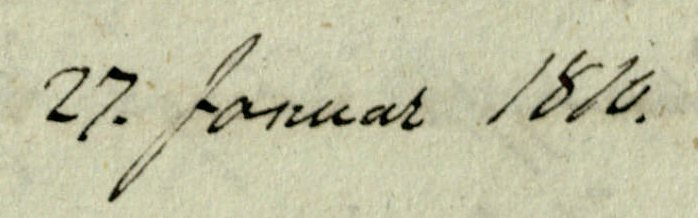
27. Januar 1810.
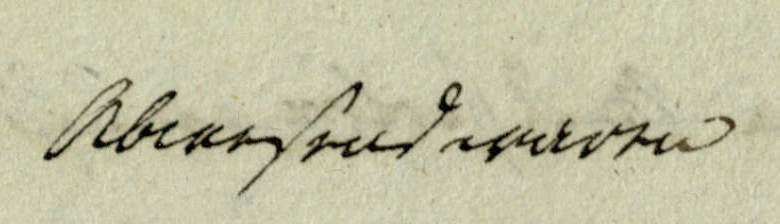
Abwesend waren
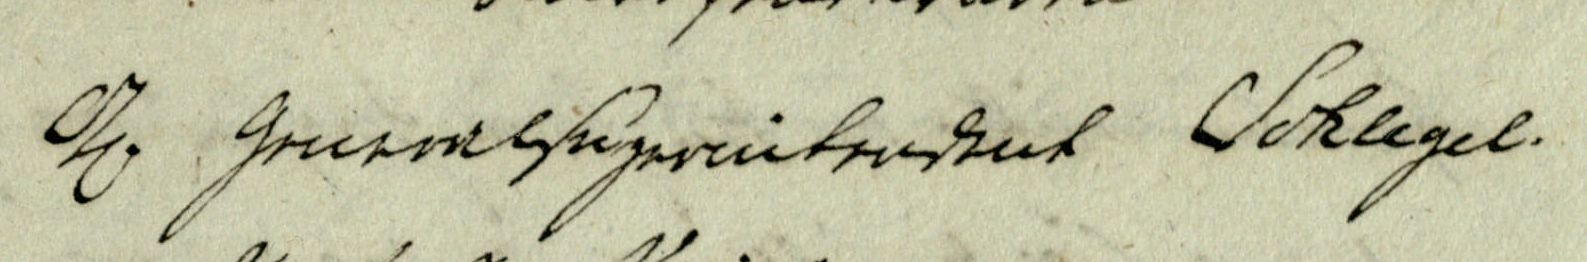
dh. Generalsuperintendent Schlegel.
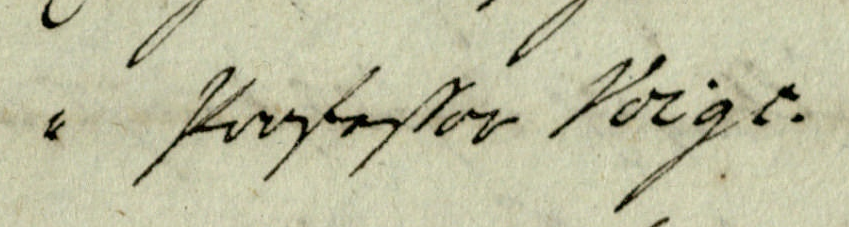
Professor Voigt.
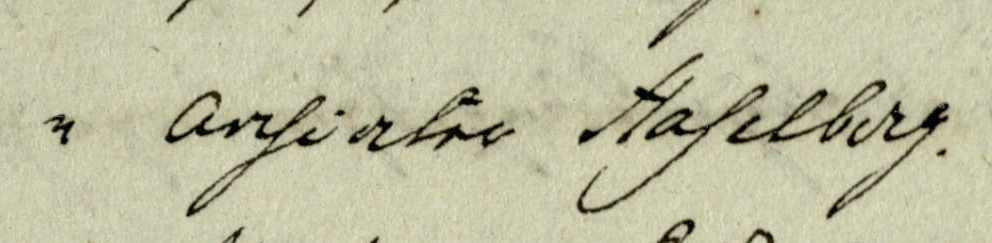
Archiater Haselberg.
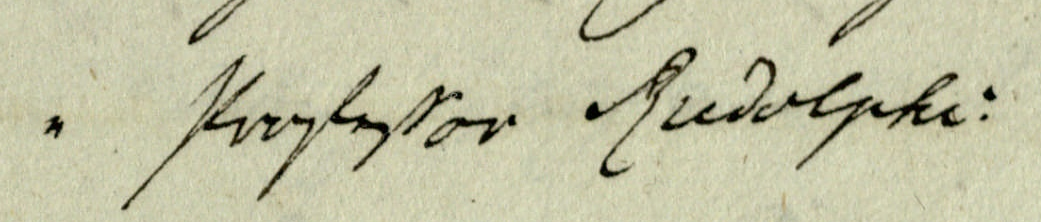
Professor Rudolphi
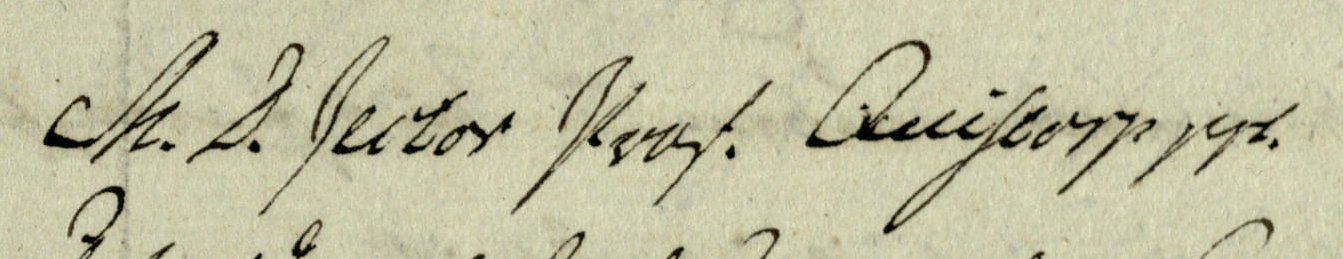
M. D. Rector Prof. Quistorp. ppr.
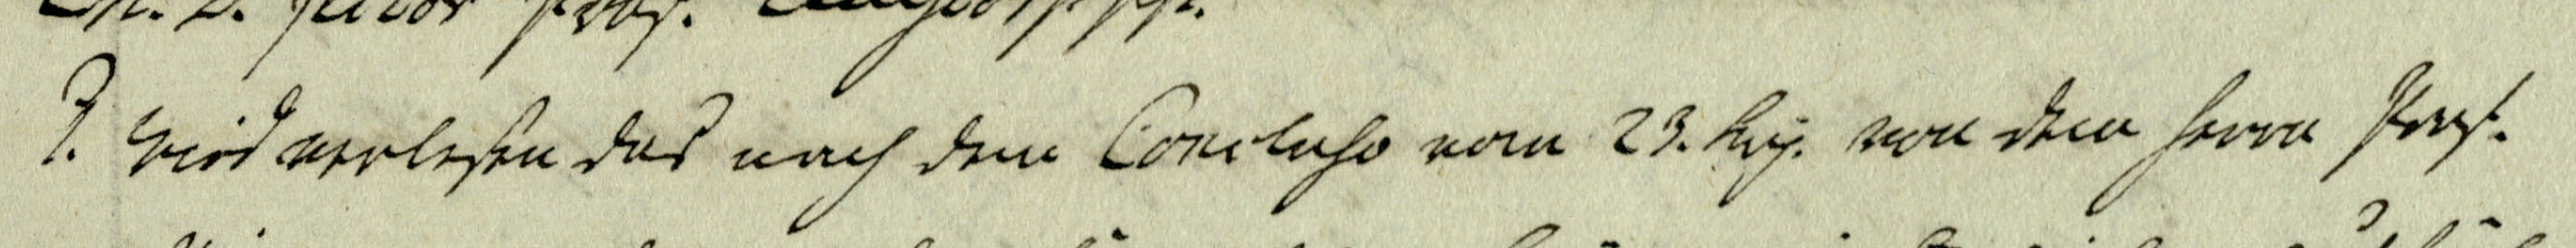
1. Wird verlesen das nach dem Concluso vom 23. huj. von dem Herrn Prof.
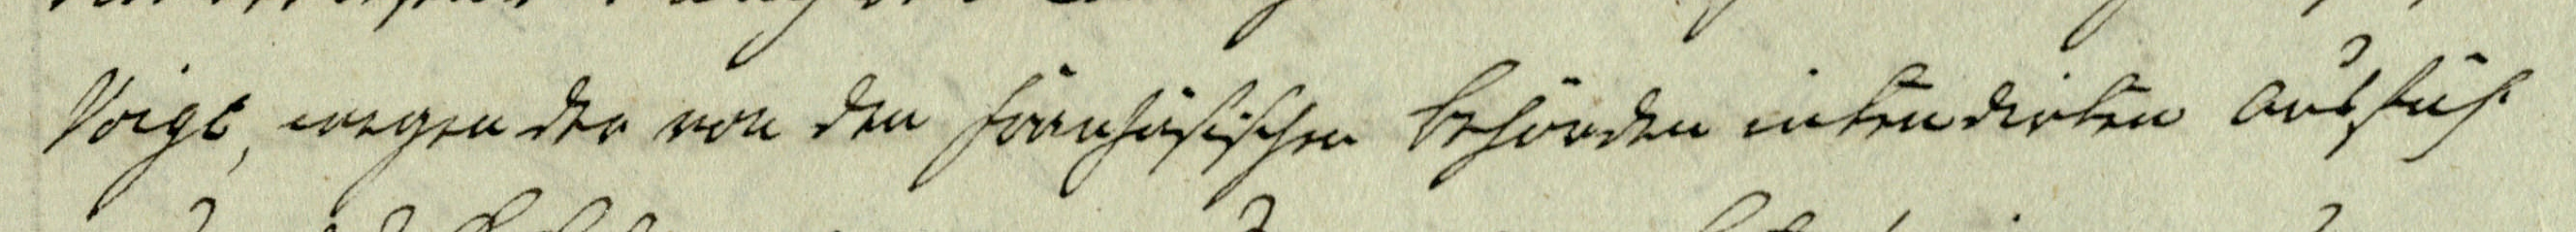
Voigt, wegen der von den Französischen Behörden intendirten Ausfüh¬
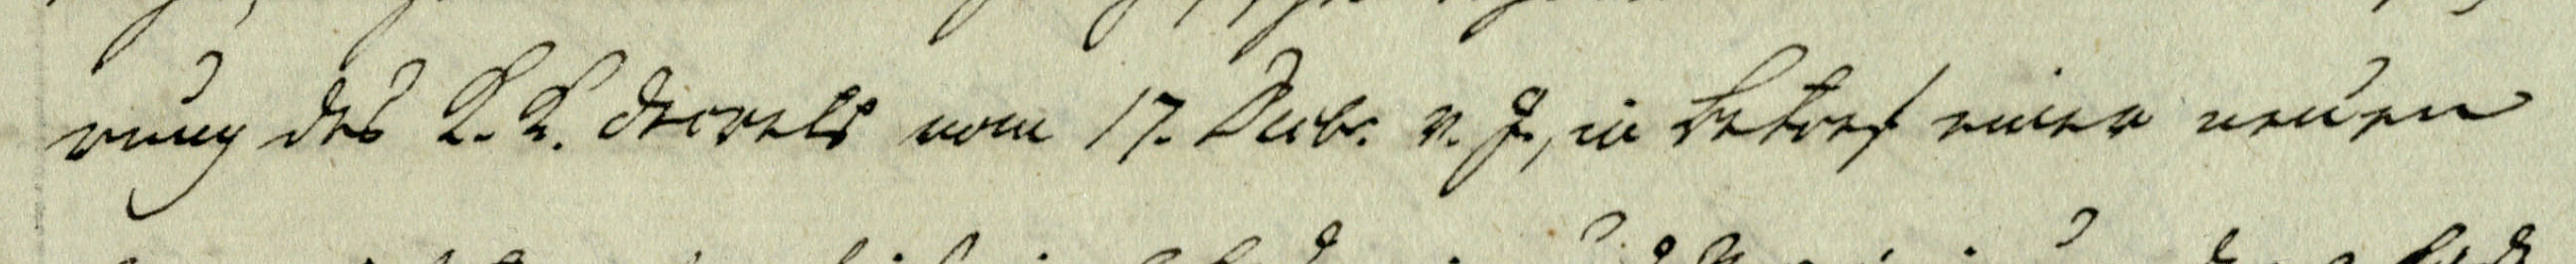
rung des K K. Decrets vom 17. Decbr. v. J. in Betref einer neuen
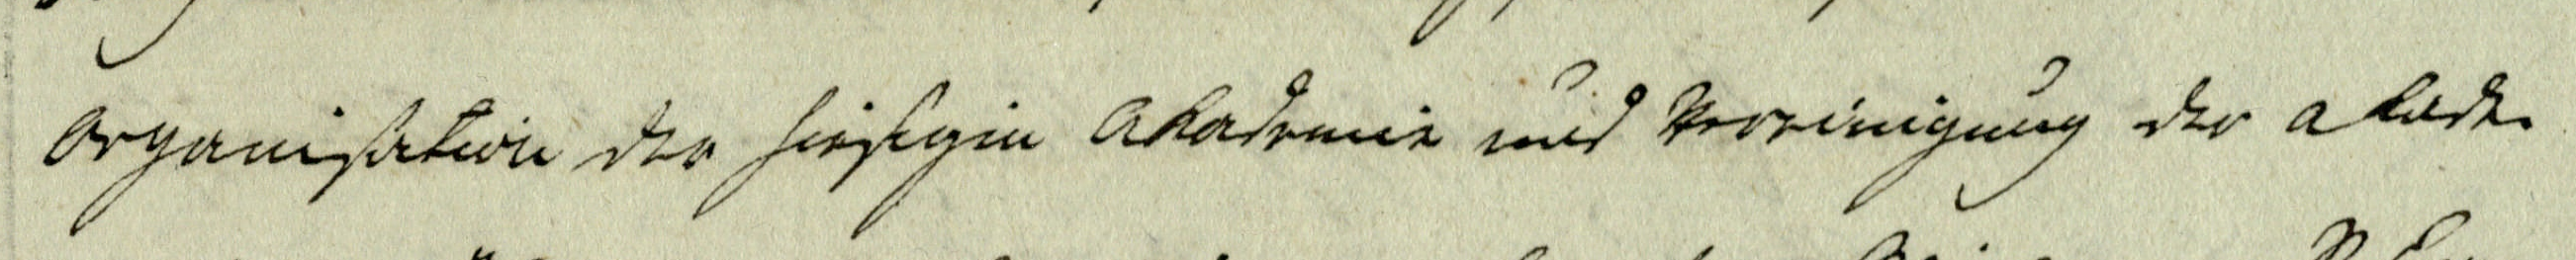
Organisation der hiesigen Akademie und Vereinigung der akade¬
